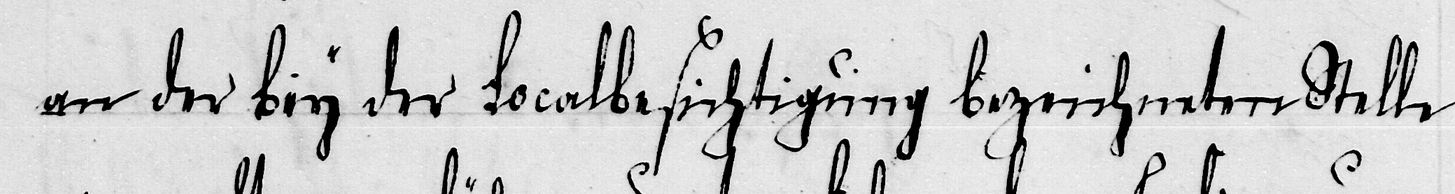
an der bey der Localbesichtigung bezeichneten Stelle
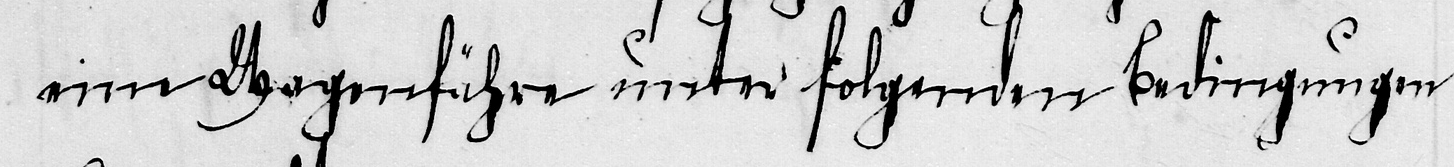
eine Wagenfähre unter folgenden Bedingungen
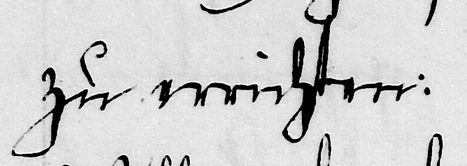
zu errichten:
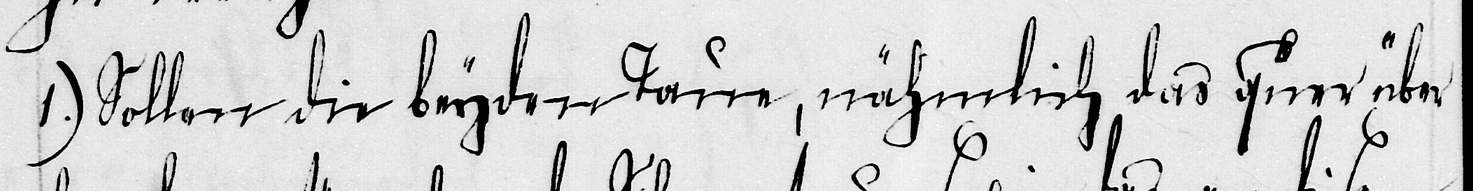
1.) Sollen die beyden Taue, nähmlich das quer über
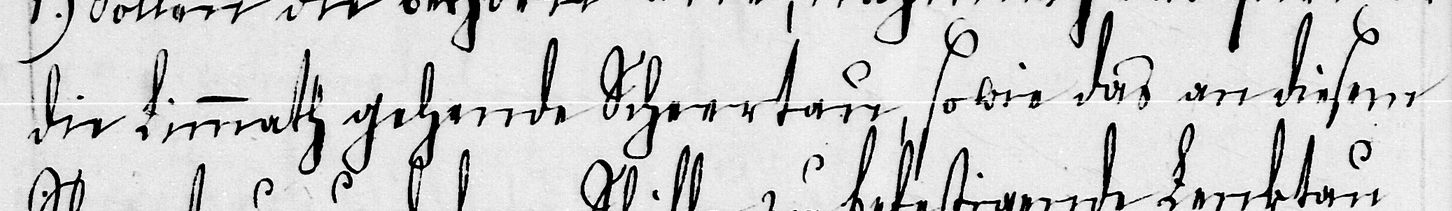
die Limmath gehende Scheertau, sowie das an diesem
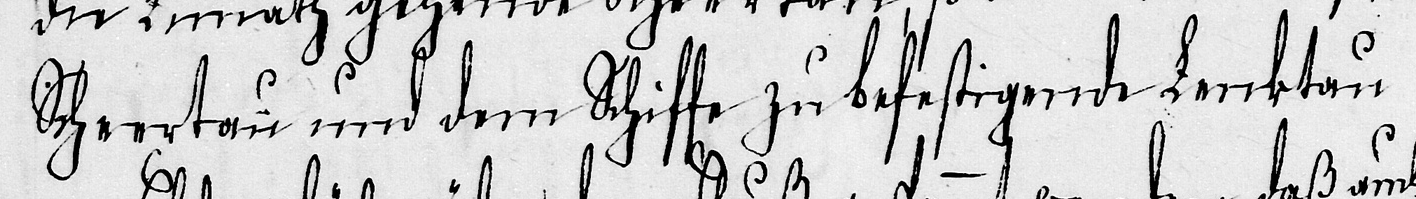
Scheertau und dem Schiffe zu befestigende Lenktau
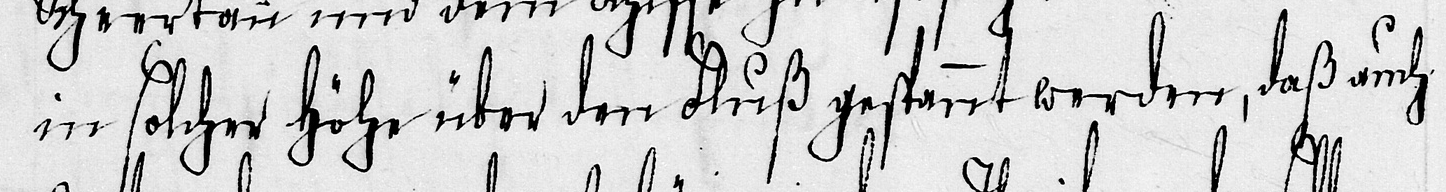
in solcher Höhe über den Fluß gespannt werden, daß auch
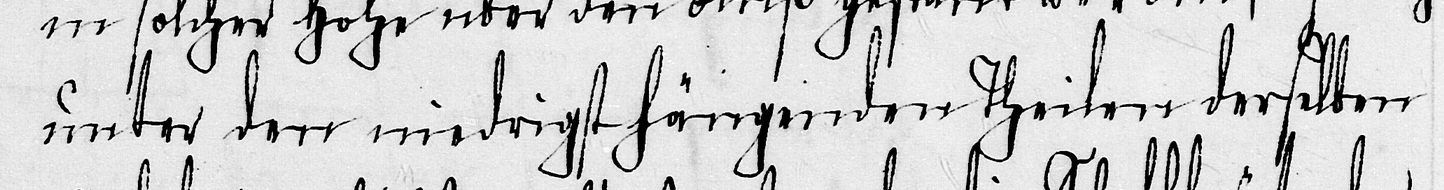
unter den niedrigst hängenden Theilen derselben
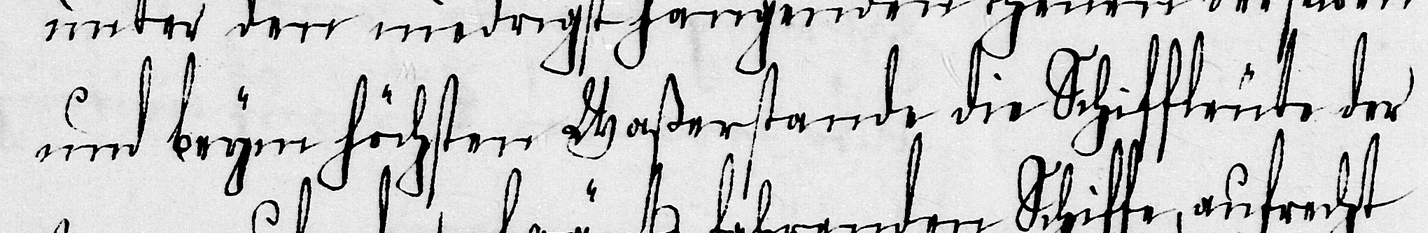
und beym höchsten Waßerstande die Schiffleute der
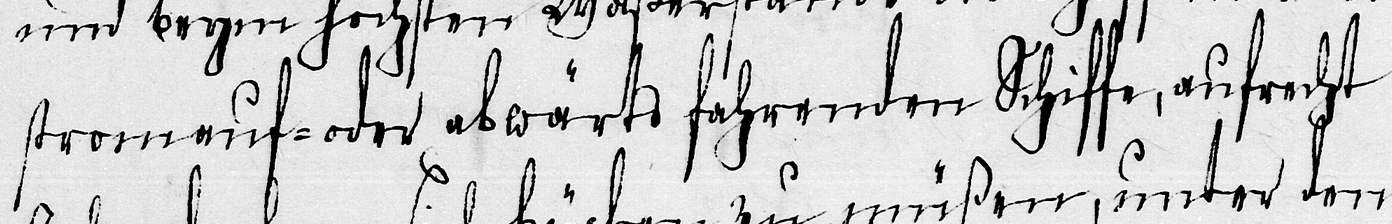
stromauf- oder abwärts fahrenden Schiffe, aufrecht
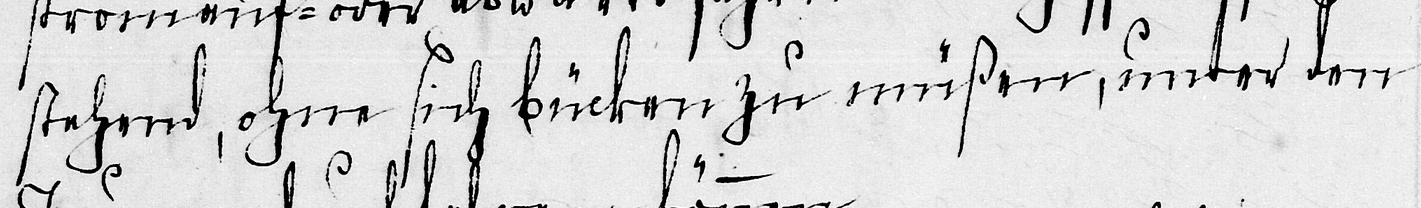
stehend ohne sich bücken zu müßen, unter den
